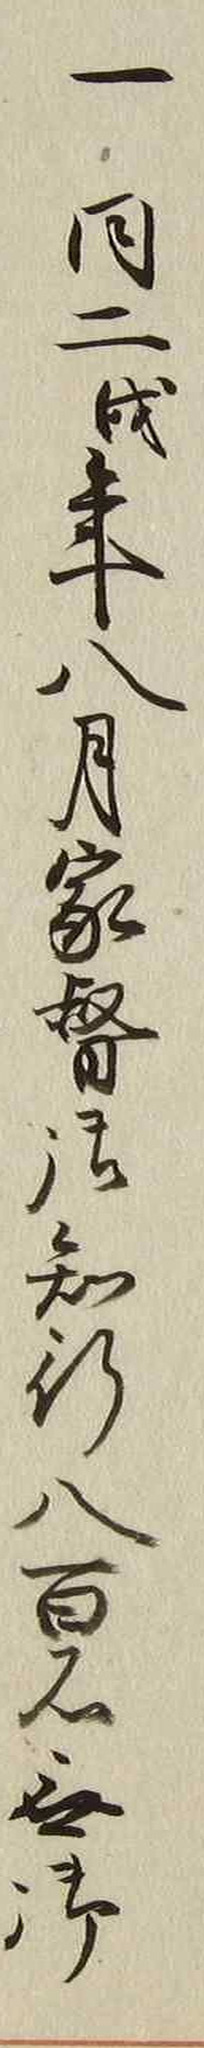一同二戌年八月家督御知行八百石無御
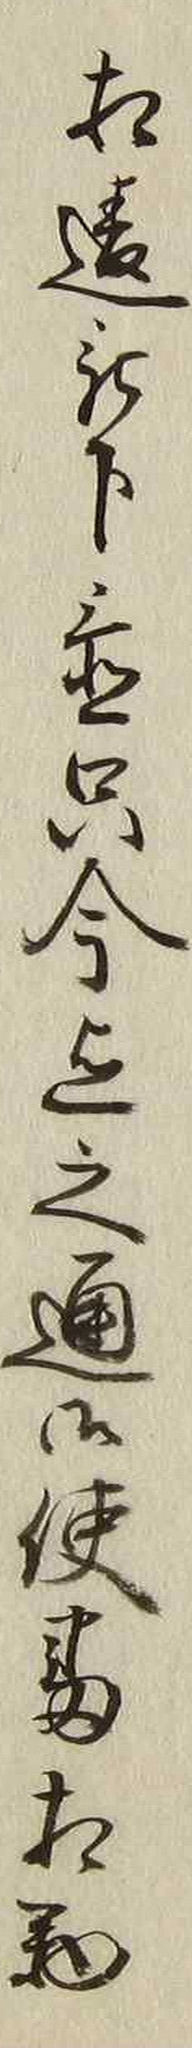相違被下置只今迄之通御使番相勤
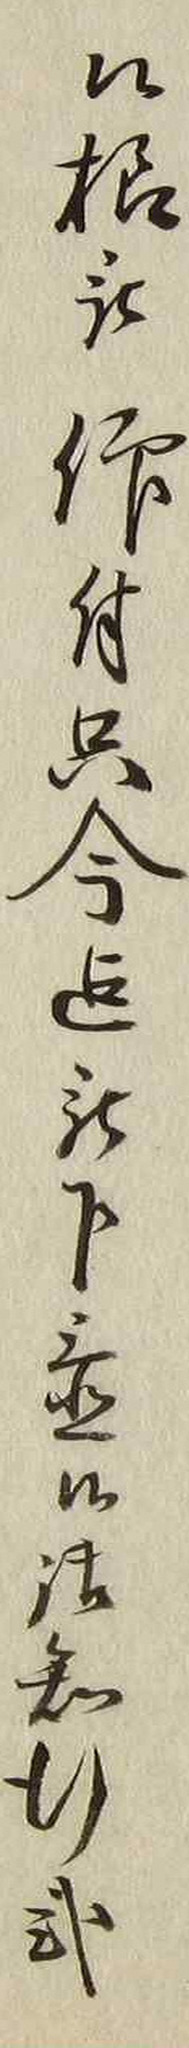候様被仰付只今迄被下置候御知行弐
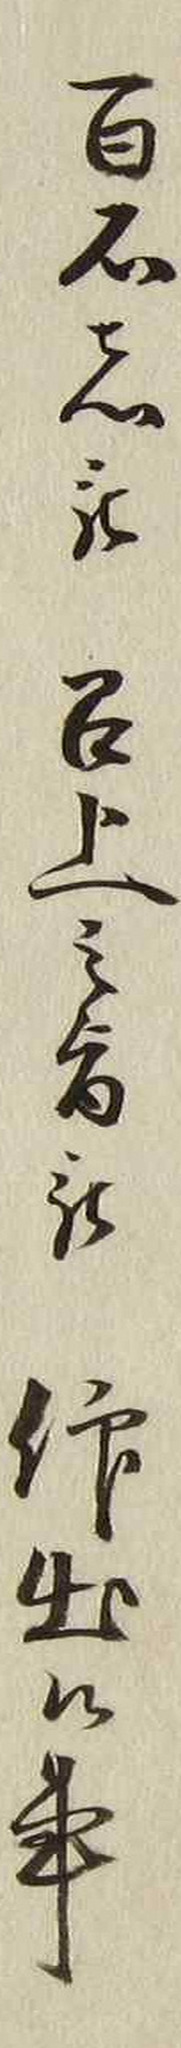百石者被召上之旨被仰出候事
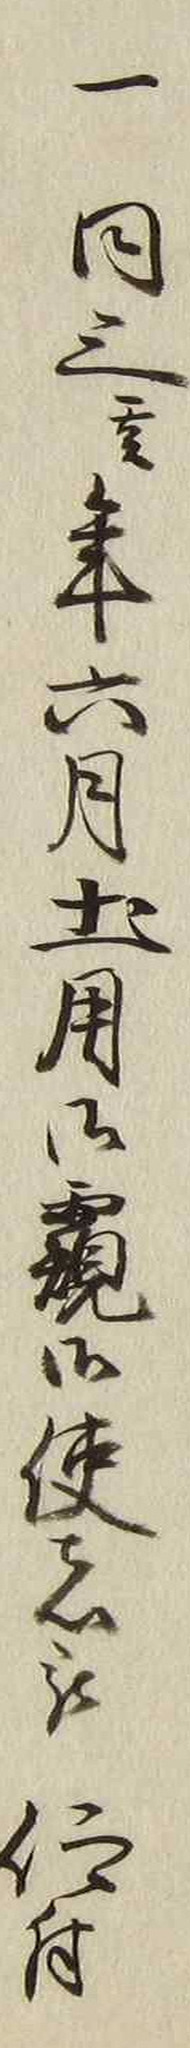一同三亥年六月土用御窺御使者被仰付
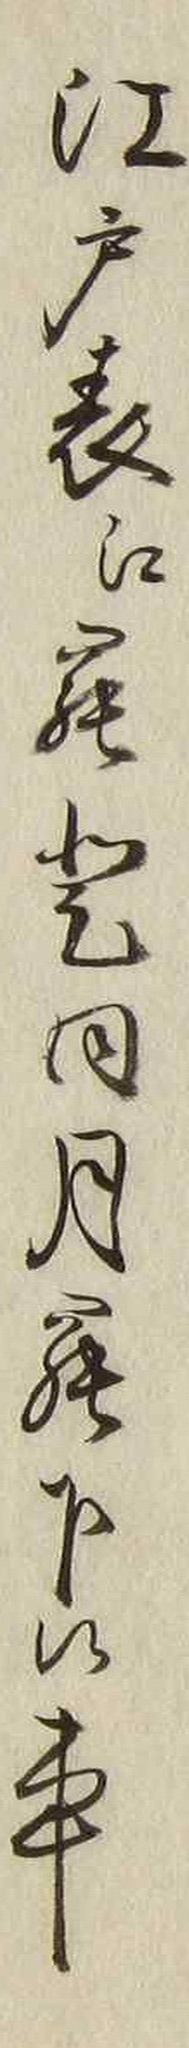江戸表江罷登同月罷下候事
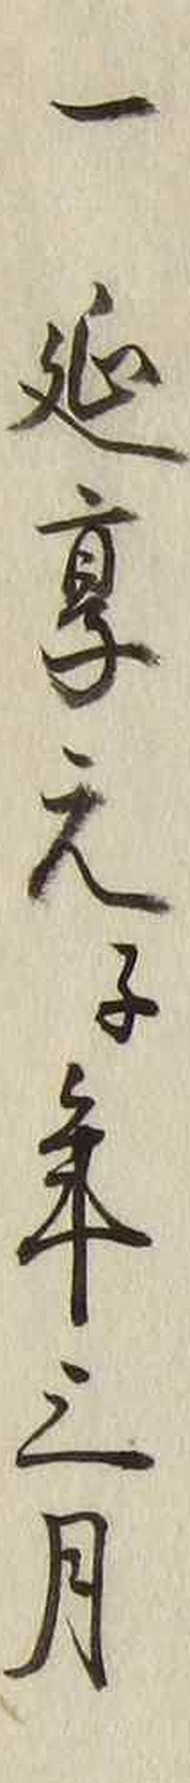一延享元子年三月

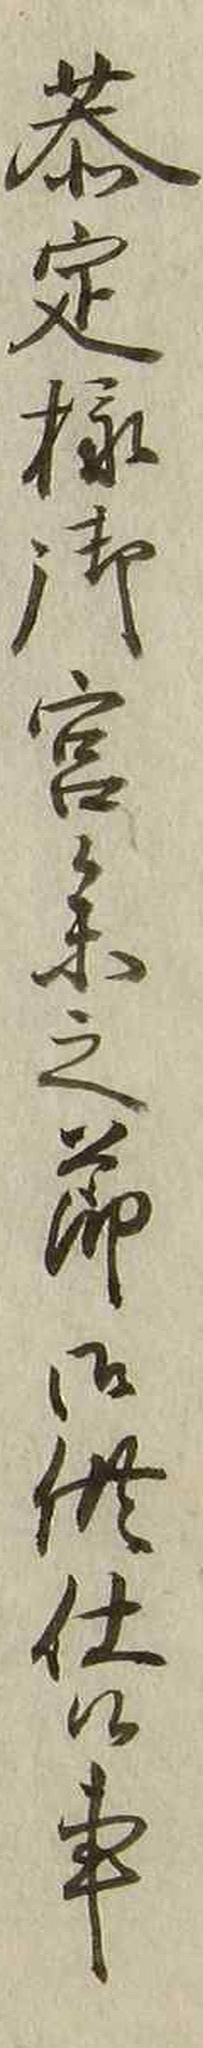恭定様御宮参之節御供仕候事
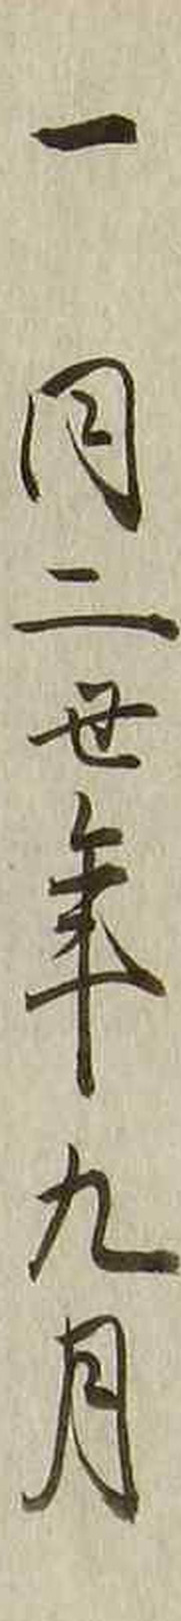一同二丑年九月
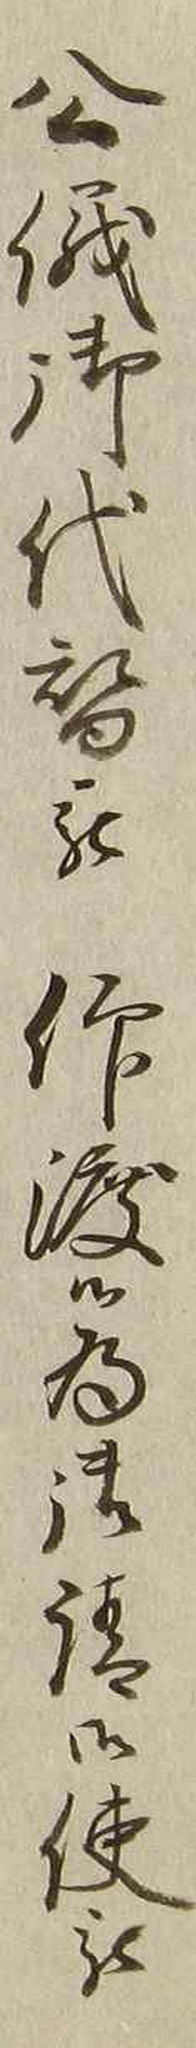公儀御代替被仰渡候為御請御使被
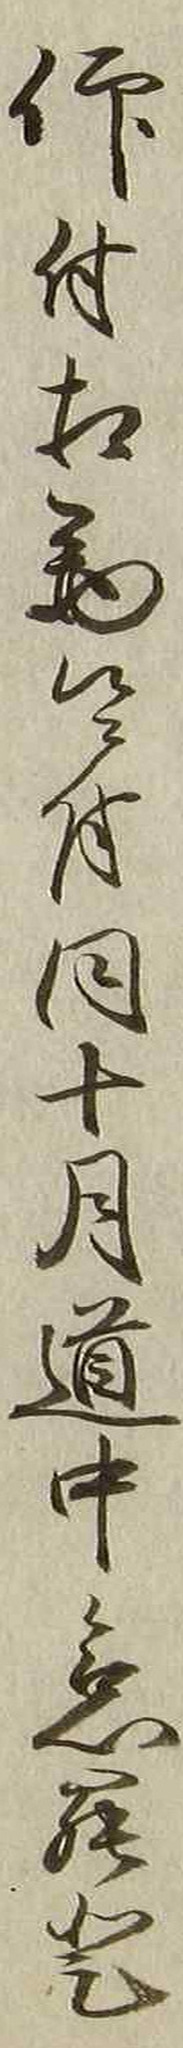仰付相勤候ニ付同十月道中急罷登
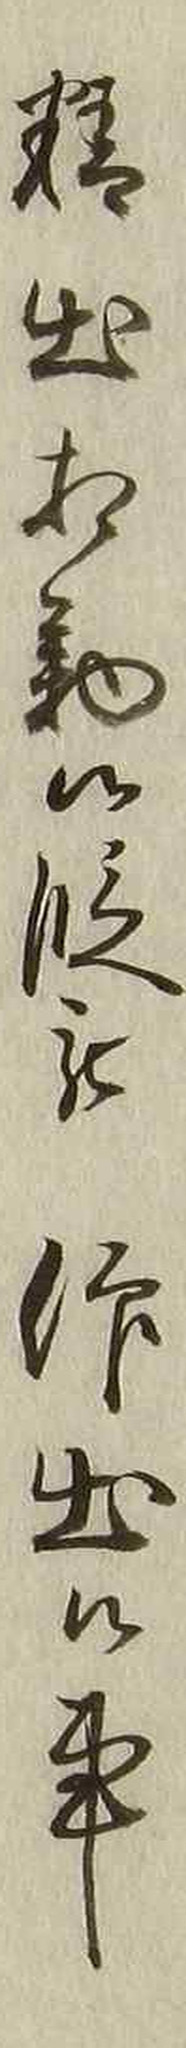精出相勤候段被仰出候事
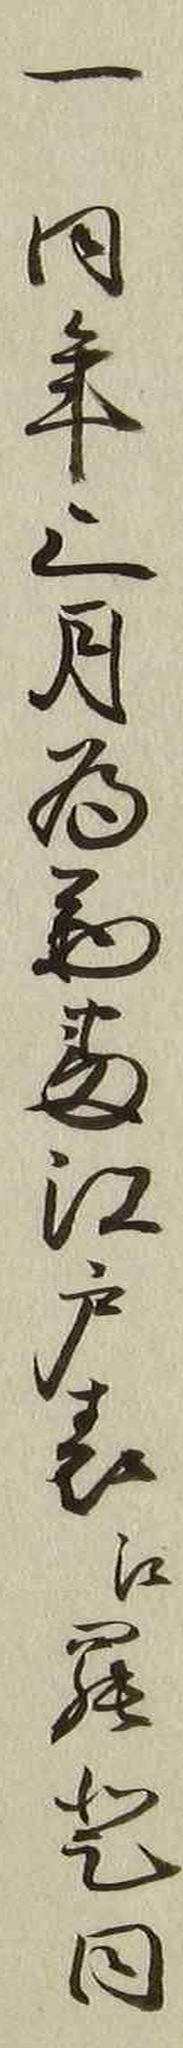一同年三月為勤番江戸表江罷登同
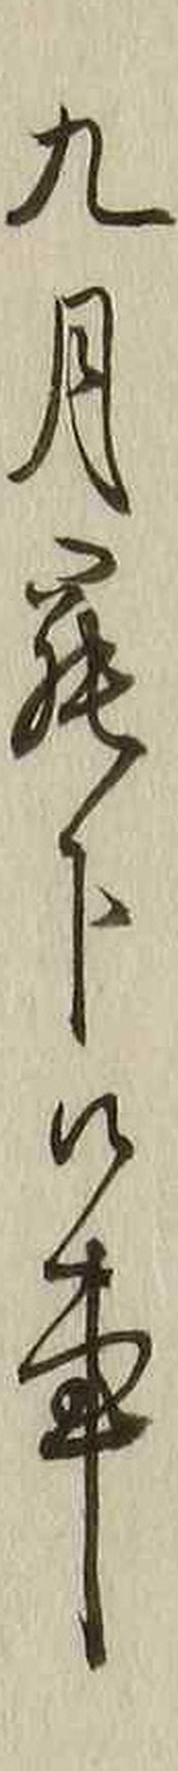九月罷下候事
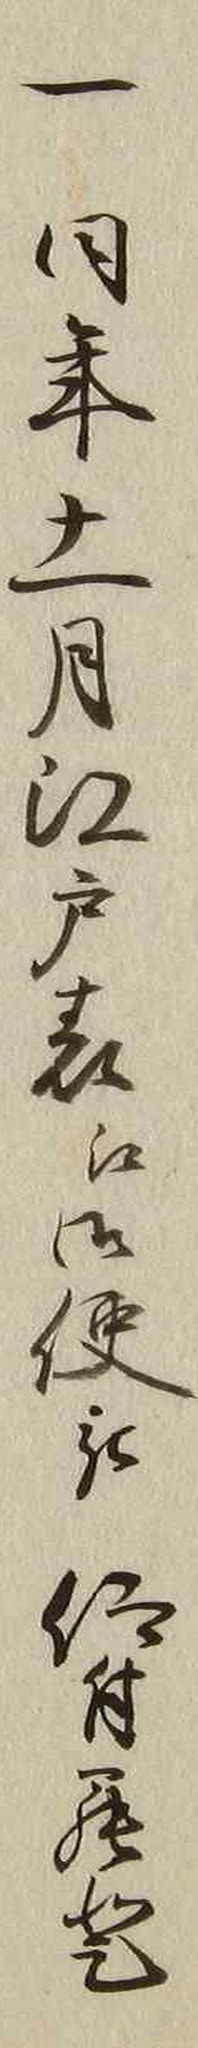一同年十一月江戸表江御使被仰付罷登
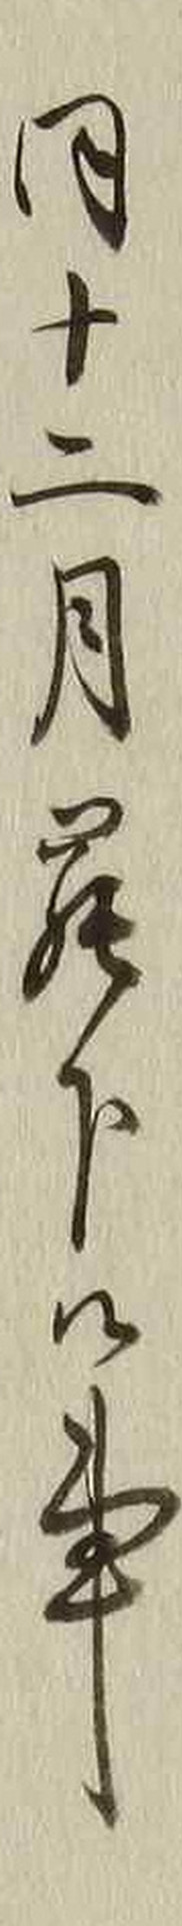同十二月罷下候事
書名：諸士系譜　巻之15　い之部15
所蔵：会津若松市立会津図書館
